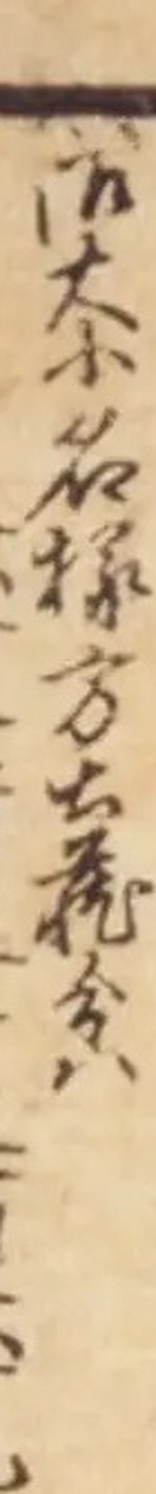御大小名様方土蔵分は
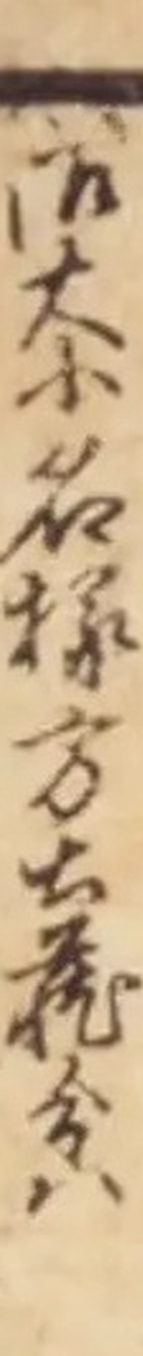御大小名様方土蔵分は
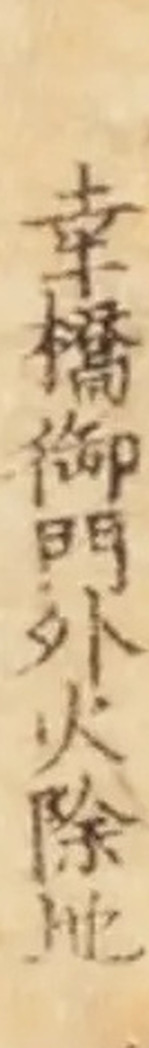幸橋御門外火除地
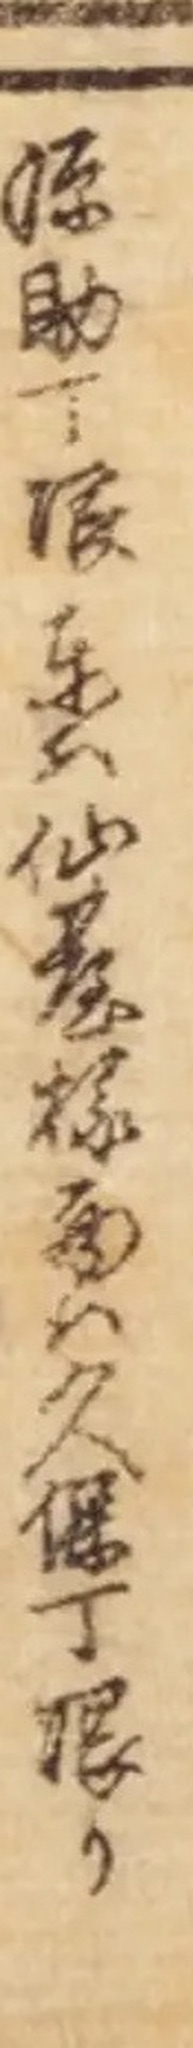源助丁限東は仙臺様西は久保丁限り
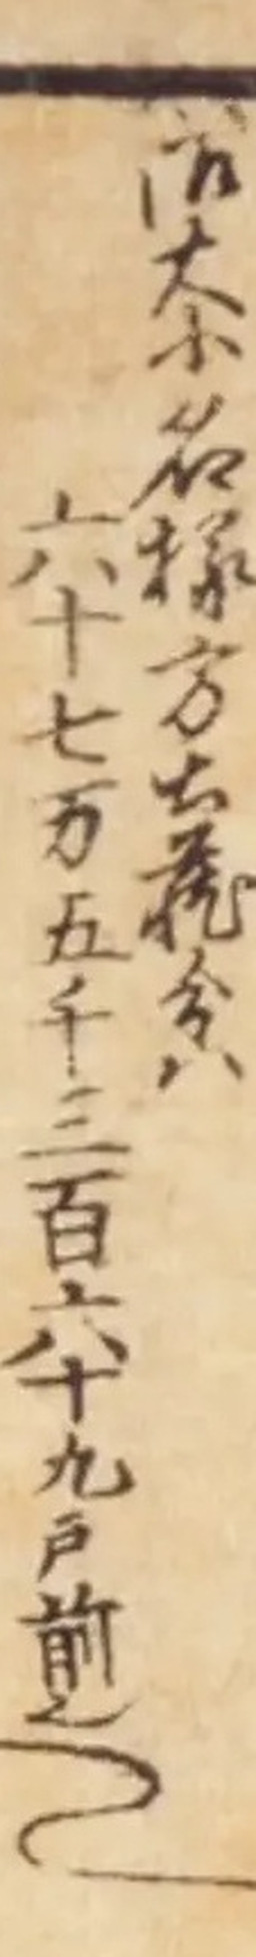六十七万五千三百六十九戸前也
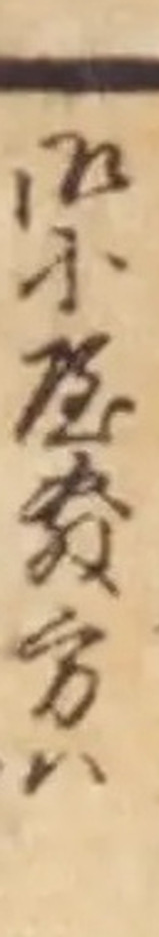御小屋敷方は
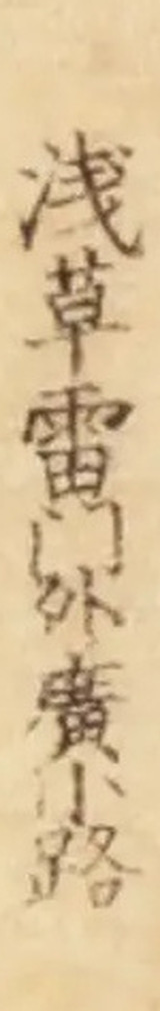浅草雷門外広小路
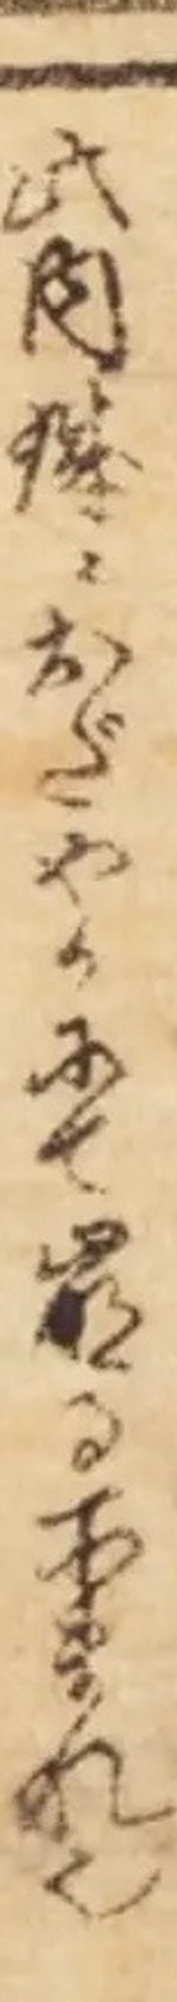此内誠におだやかにて崩る所まれ也
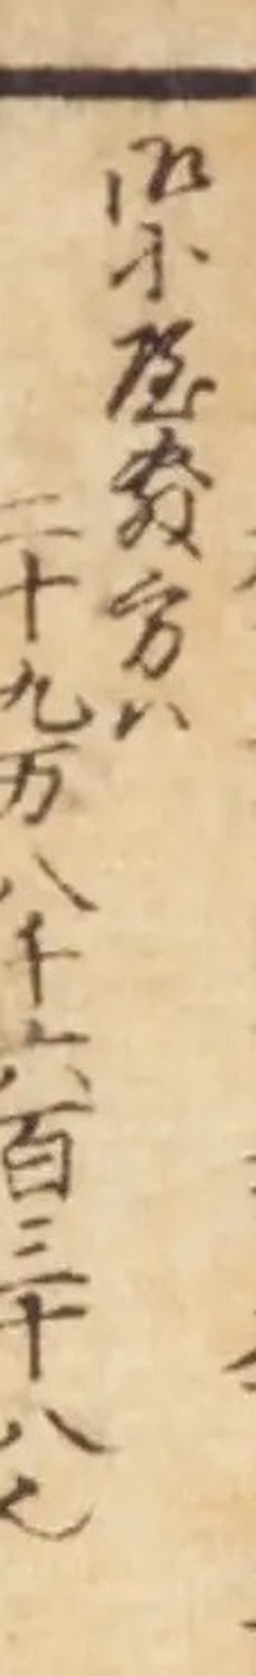二十九万八千六百三十八也
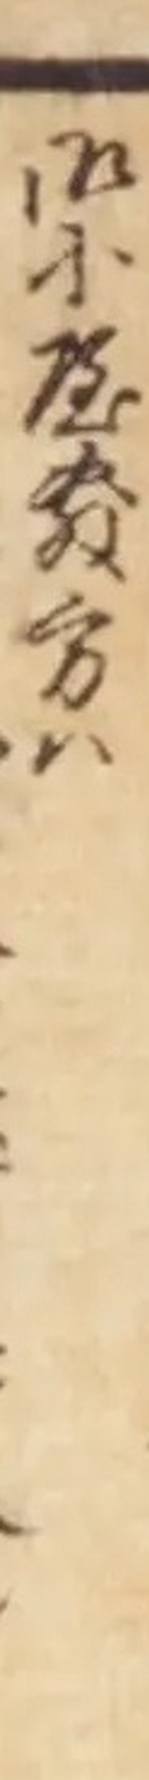御小屋敷方は
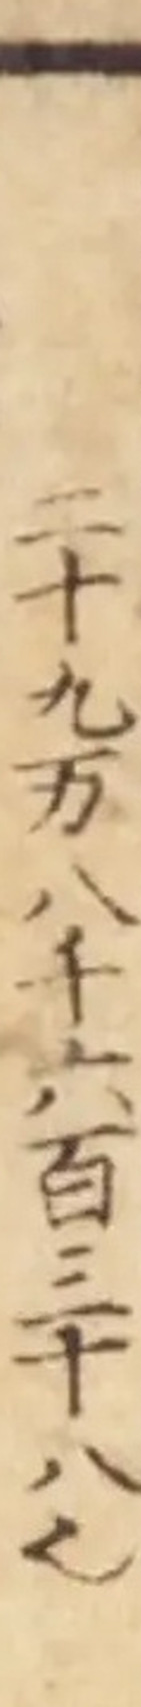二十九万八千六百三十八也
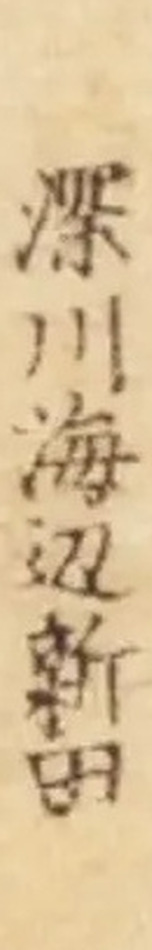深川海辺新田
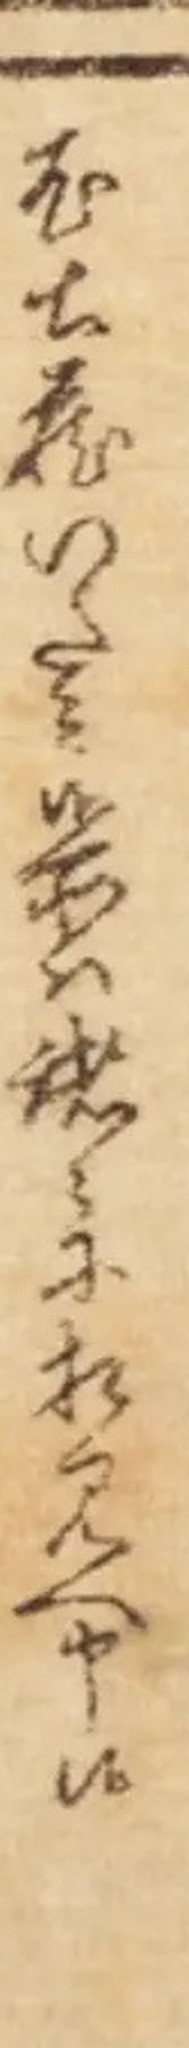尤土蔵いたみ候所は諸〻に相見へ申候
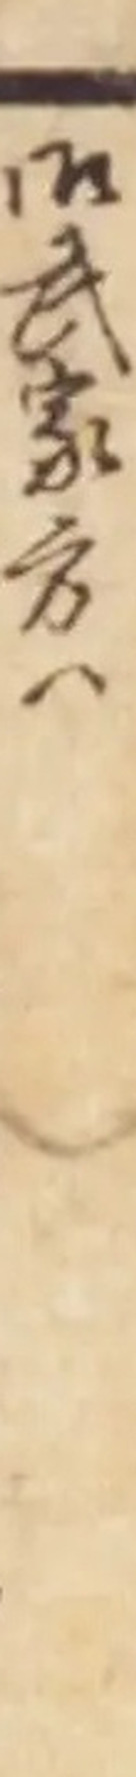御武家方は
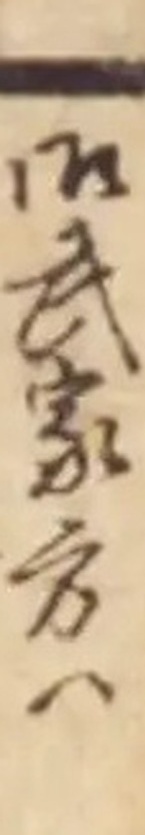御武家方は
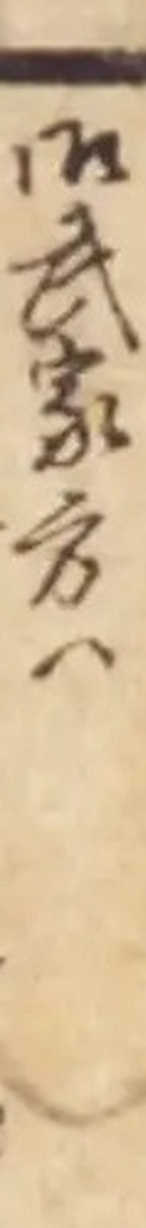御武家方は
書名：御江戸関八州大地震出火巨細記
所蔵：国立国会図書館 National Diet Library, JAPAN
